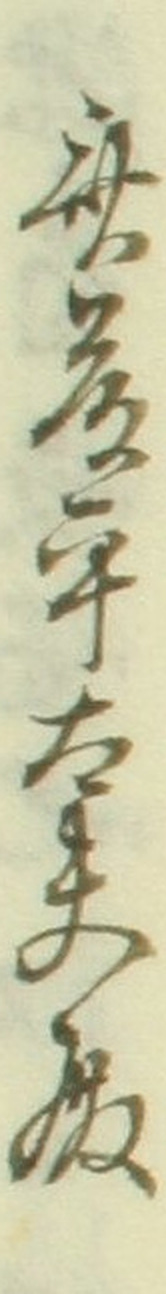斉藤平太夫殿
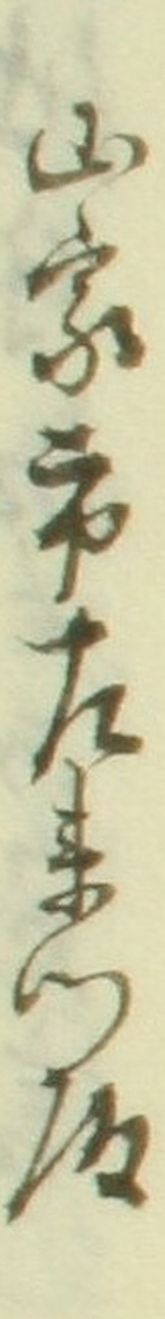山家市左衛門殿

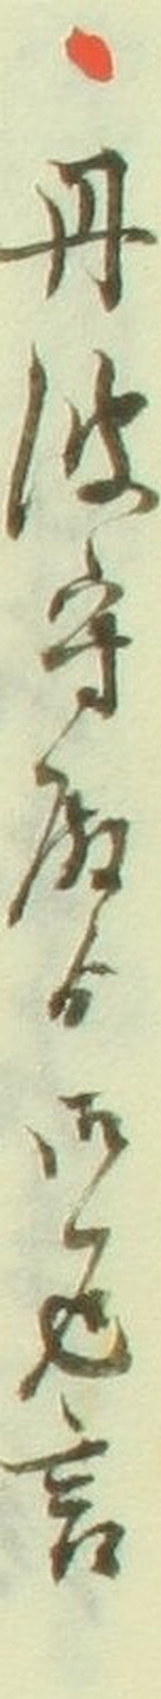丹波守殿ゟ御返言
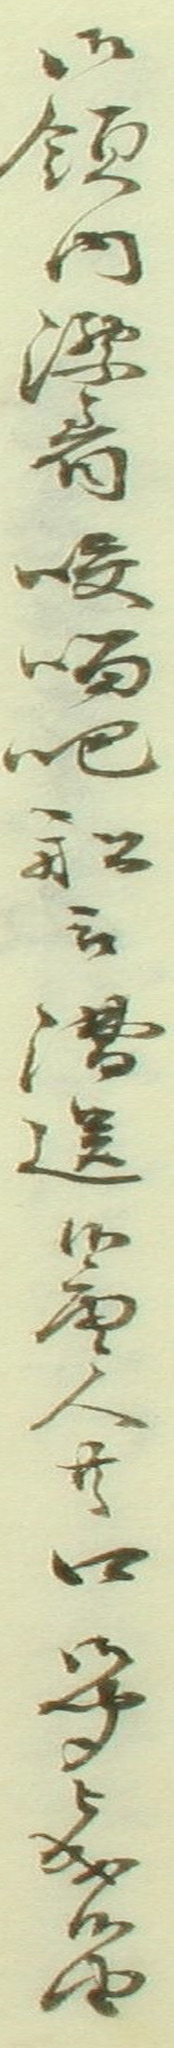御領内漂着咬𠺕吧船え漕送候唐人共口御聞被成候由
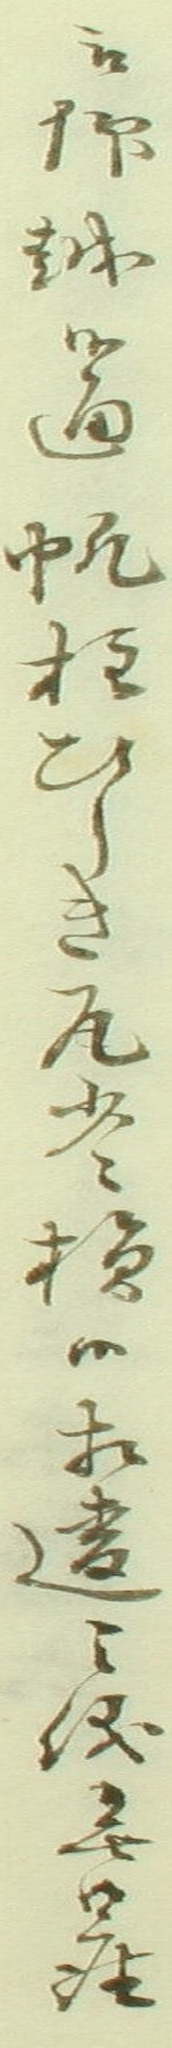被仰越候通帆柱ひしき丸少々損候相違之儀無御座
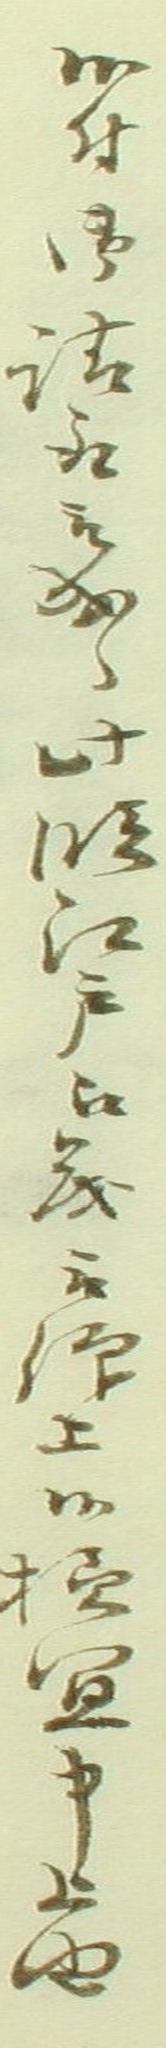候付御請取被成候此段江戸えも被仰上候様申上由
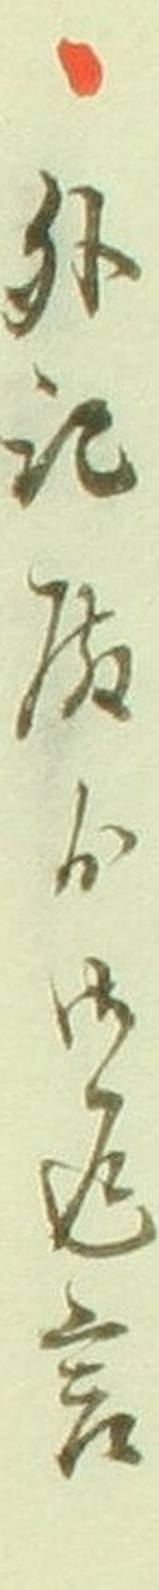外記殿ゟ御返言
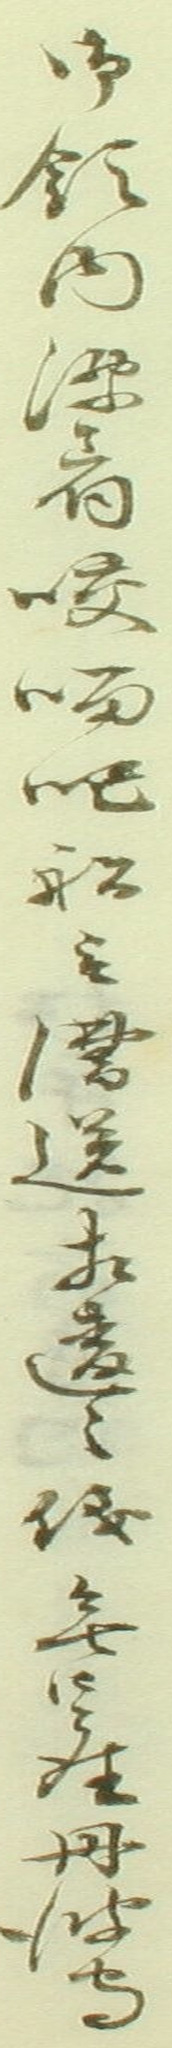御領内漂着咬𠺕吧船被漕送相違之儀無御座丹波守
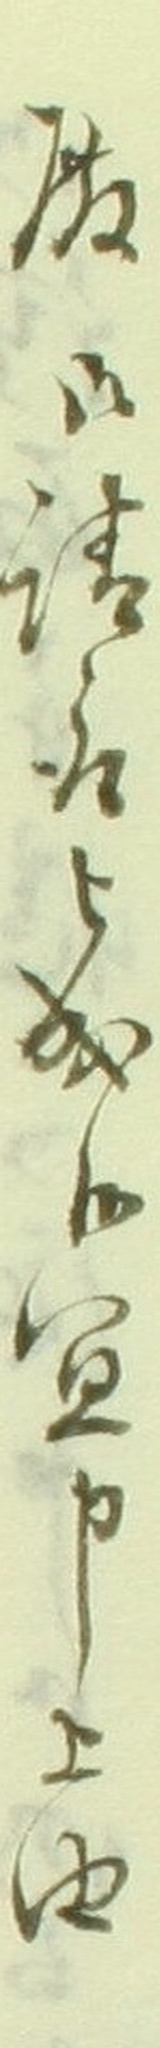殿御請取被成候宜申上由
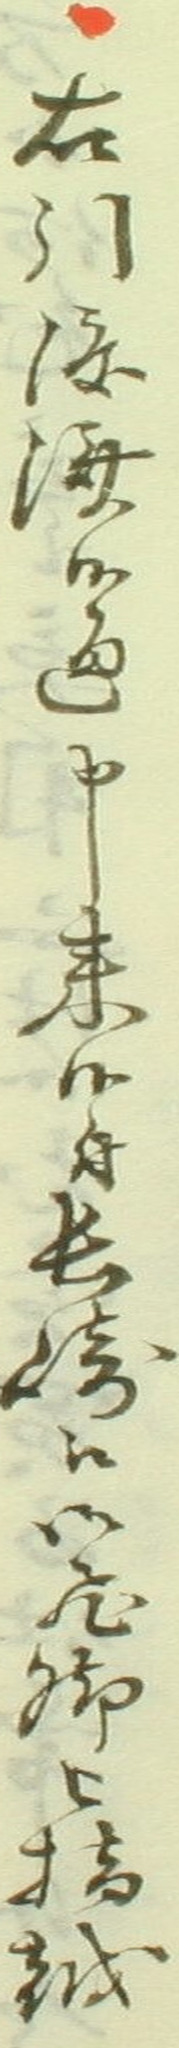右引渡済候通申来候付長崎え御飛脚被指越
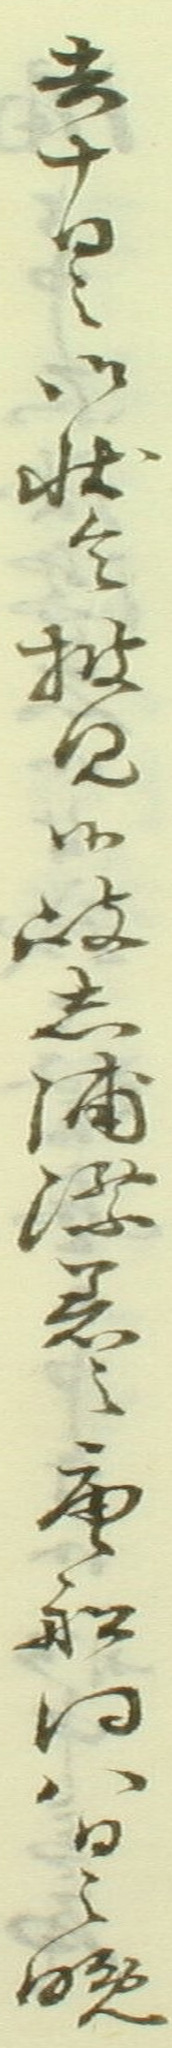去十日之御状令披見候岐志浦漂着之唐船同之晩
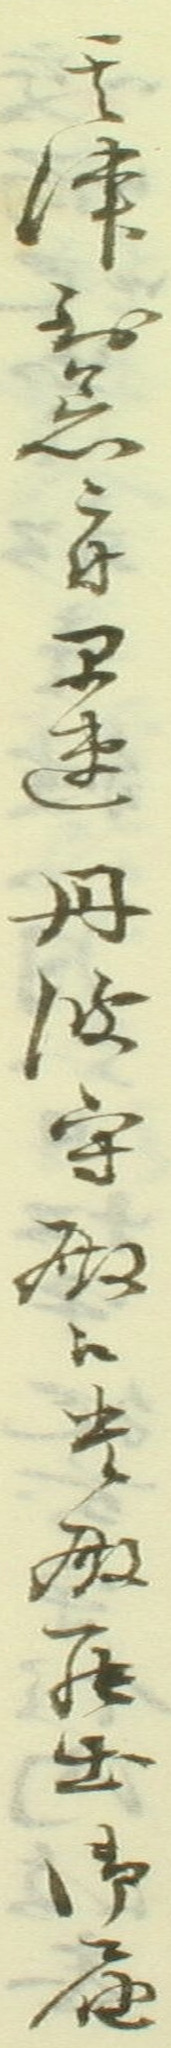其津到着に付早速丹波守殿え貴殿罷出御届
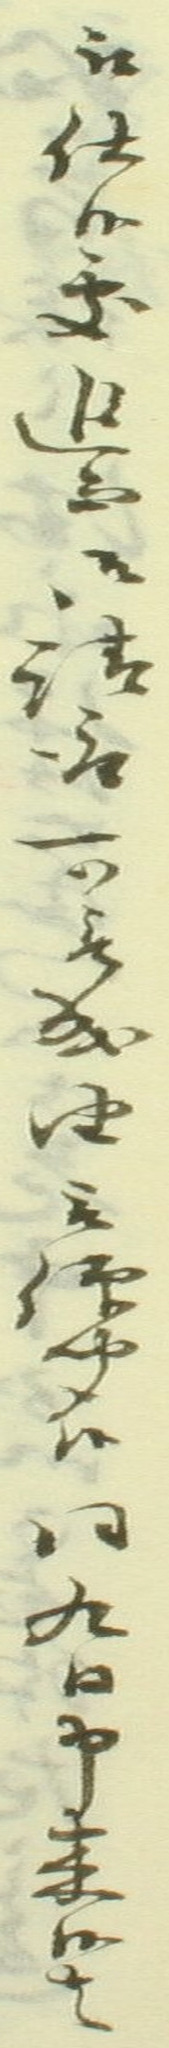被仕候処追而御請取可被成由被仰聞候同九日申来候は
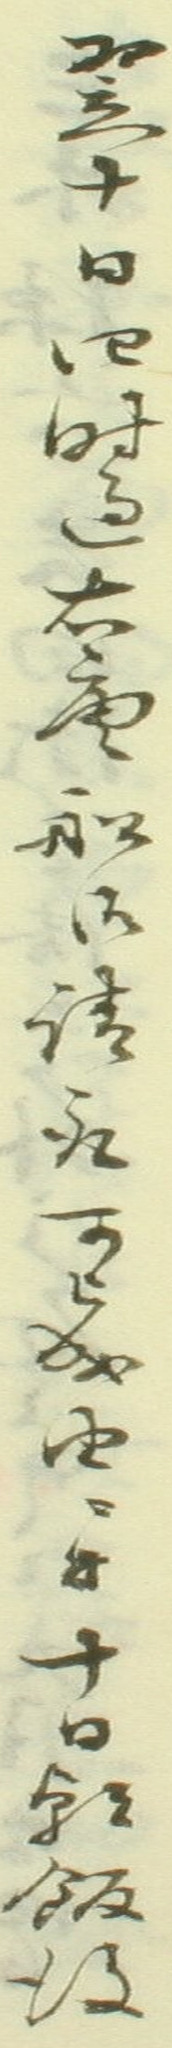翌十日過右唐船御請取可被成由に付十日朝飯後
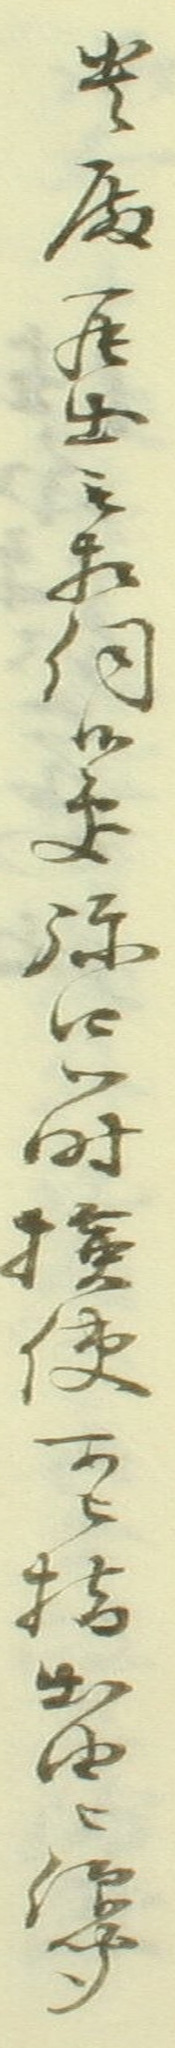貴殿罷出被相伺候処弥四ッ時検使可被指出由被仰聞
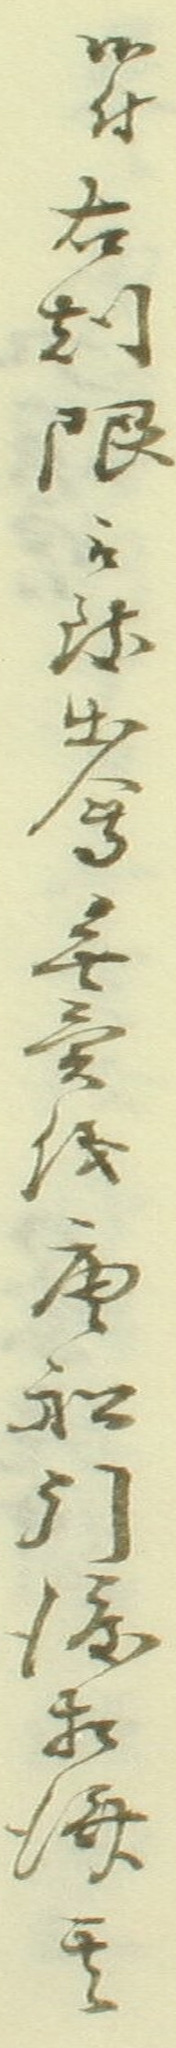候付右刻限被致出会無異儀唐船引渡相済其
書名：異国船漂着記
